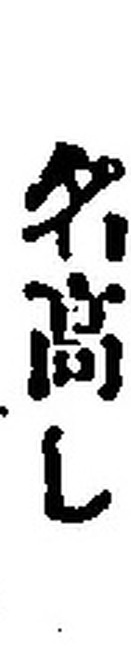名高し
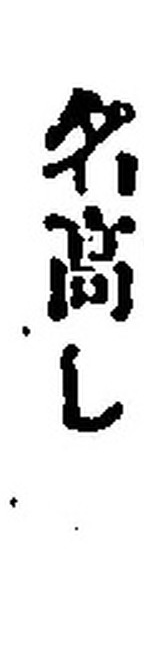名高し
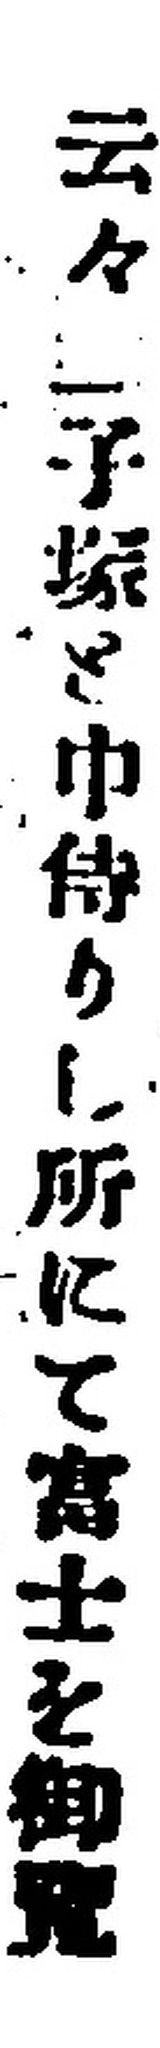云々二子塚と申侍りし所にて富士を御覧
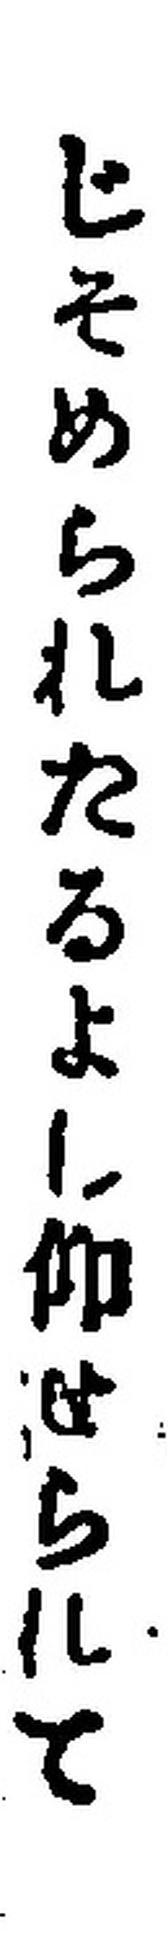じそめられたるよし仰せられて
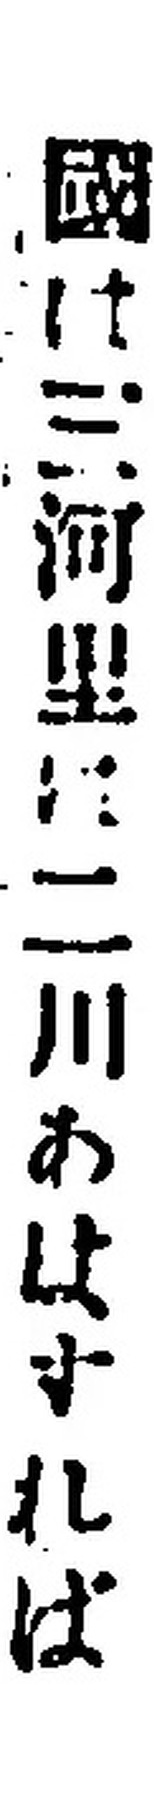国は三河里は二川あはすれば
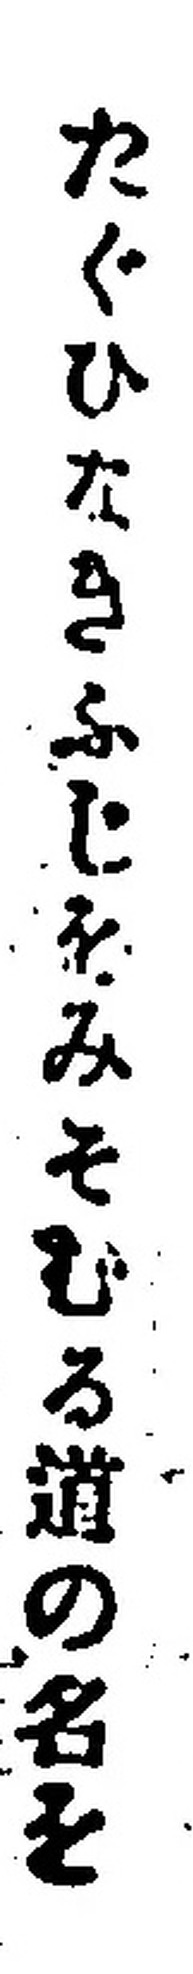たぐひなきふじをみそむる道の名を
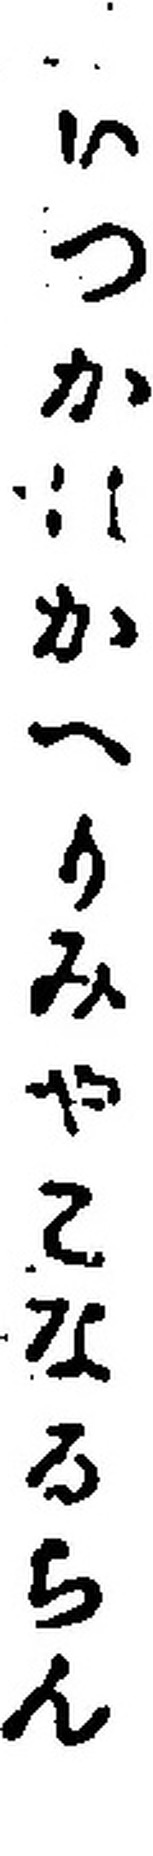いつかはかへりみやこなるらん
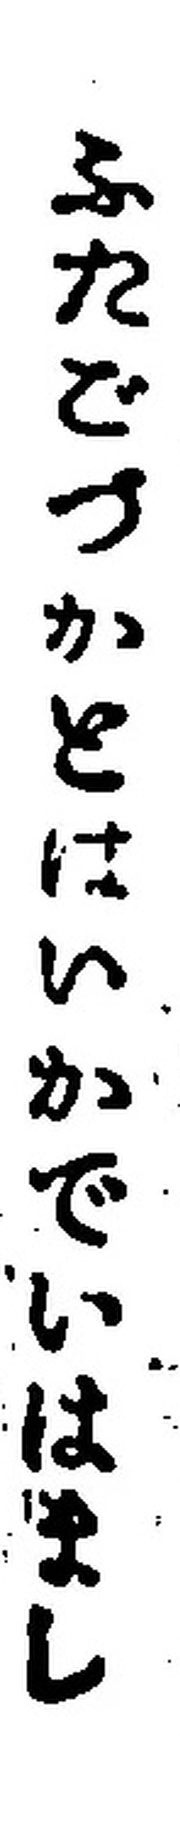ふたごづかとはいかでいはまし
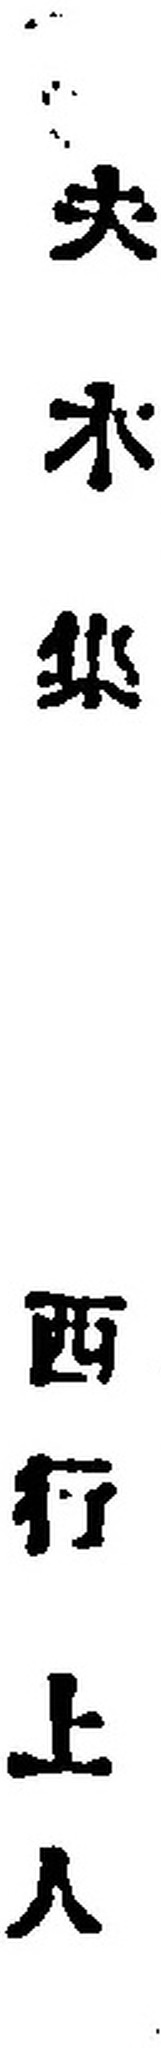夫木集西行上人
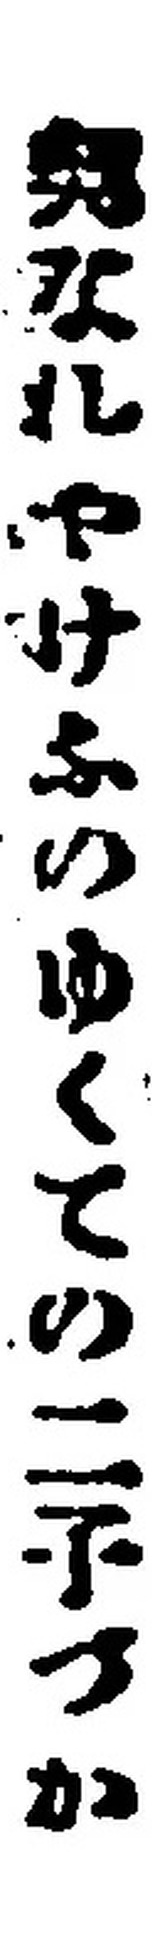契なれやけふのゆくての二子づか
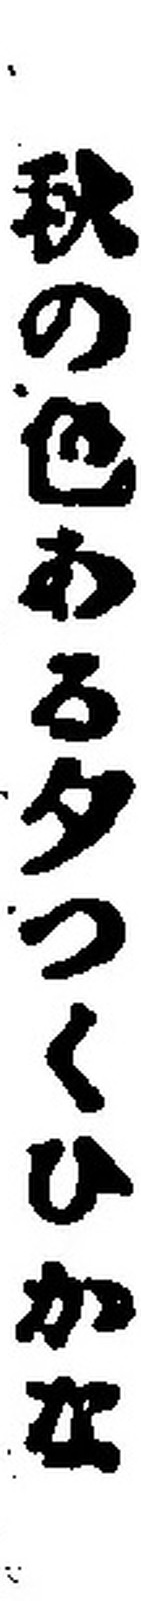秋の色ある夕つくひかな
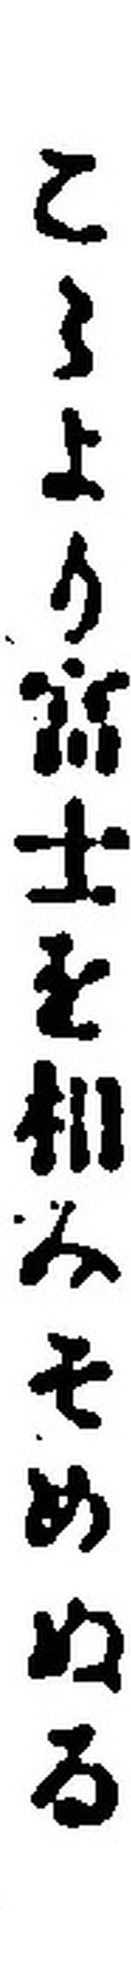こゝより富士を相みそめぬる
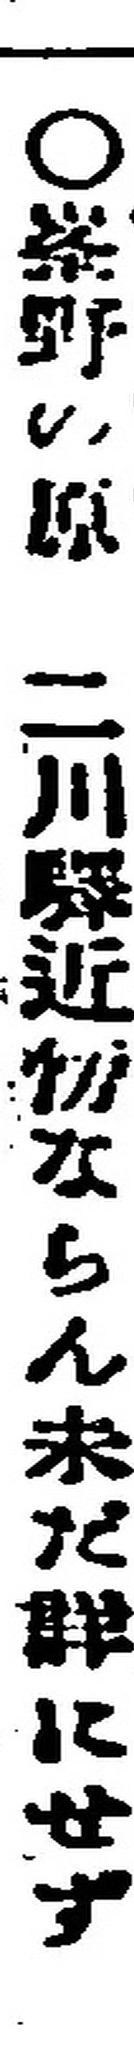○峯野の原二川駅近傍ならん未だ詳にせず
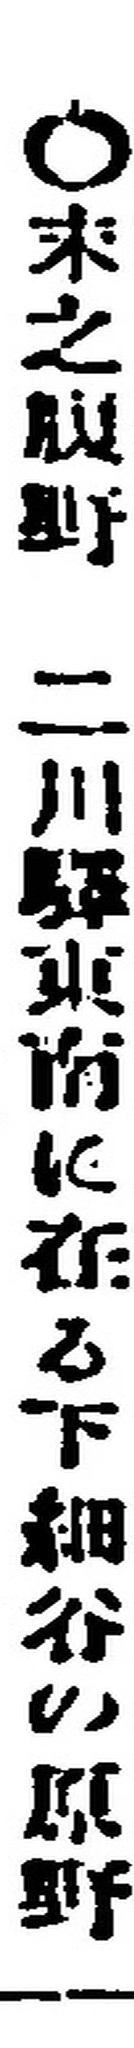○末之腹野二川駅東南に在る下細谷の原野
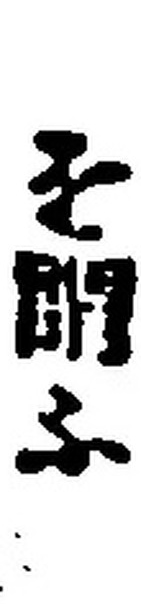を謂ふ
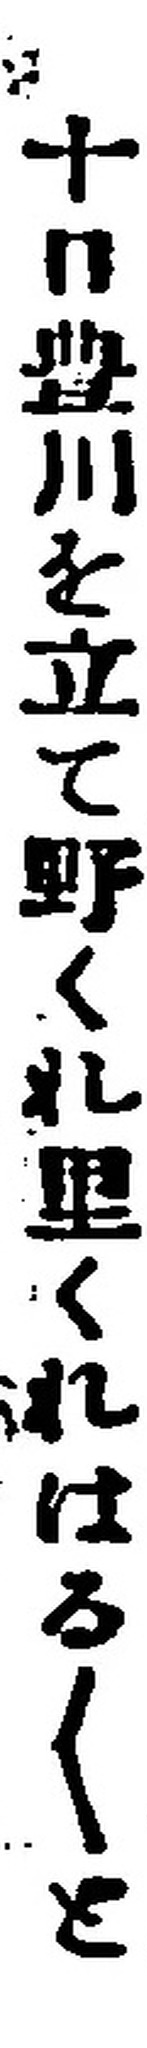十日豊川を立て野くれ里くれはる〳〵と
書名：東参名勝案内
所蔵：国立国会図書館 National Diet Library, JAPAN
